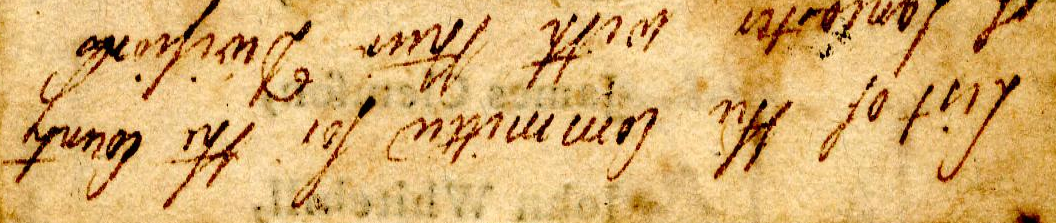List of the Committee for the County
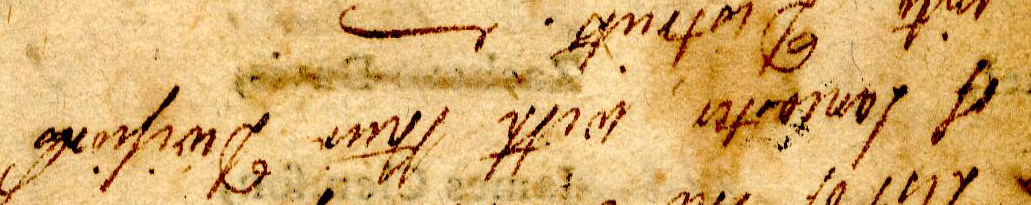of Lancaster, with their Divisions
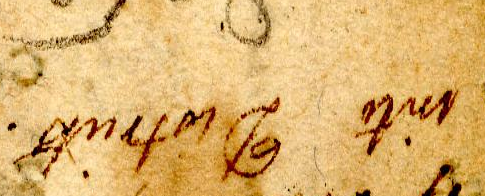into Districts.
